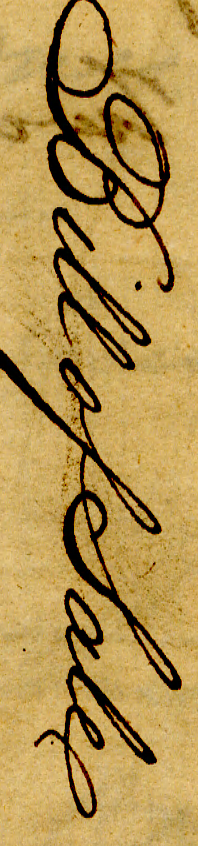Bill of Sale
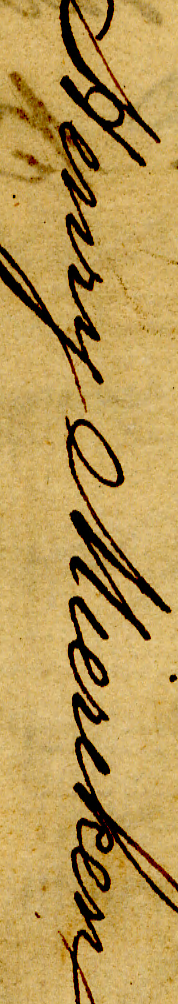Henry Miercken
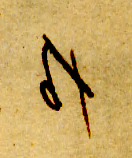to
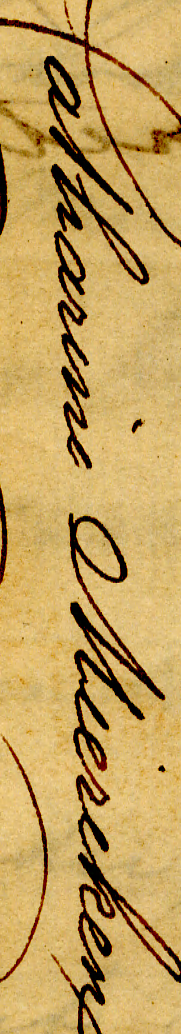Catharine Miercken
